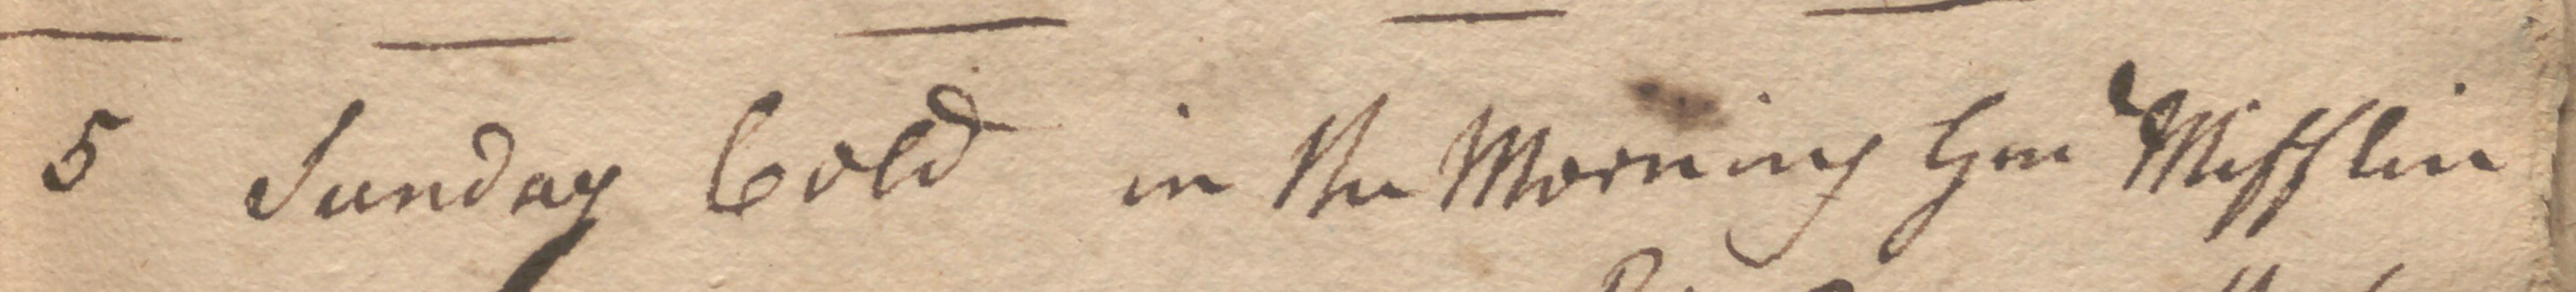5 Sunday Cold in the Morning Gen^l Mifflin
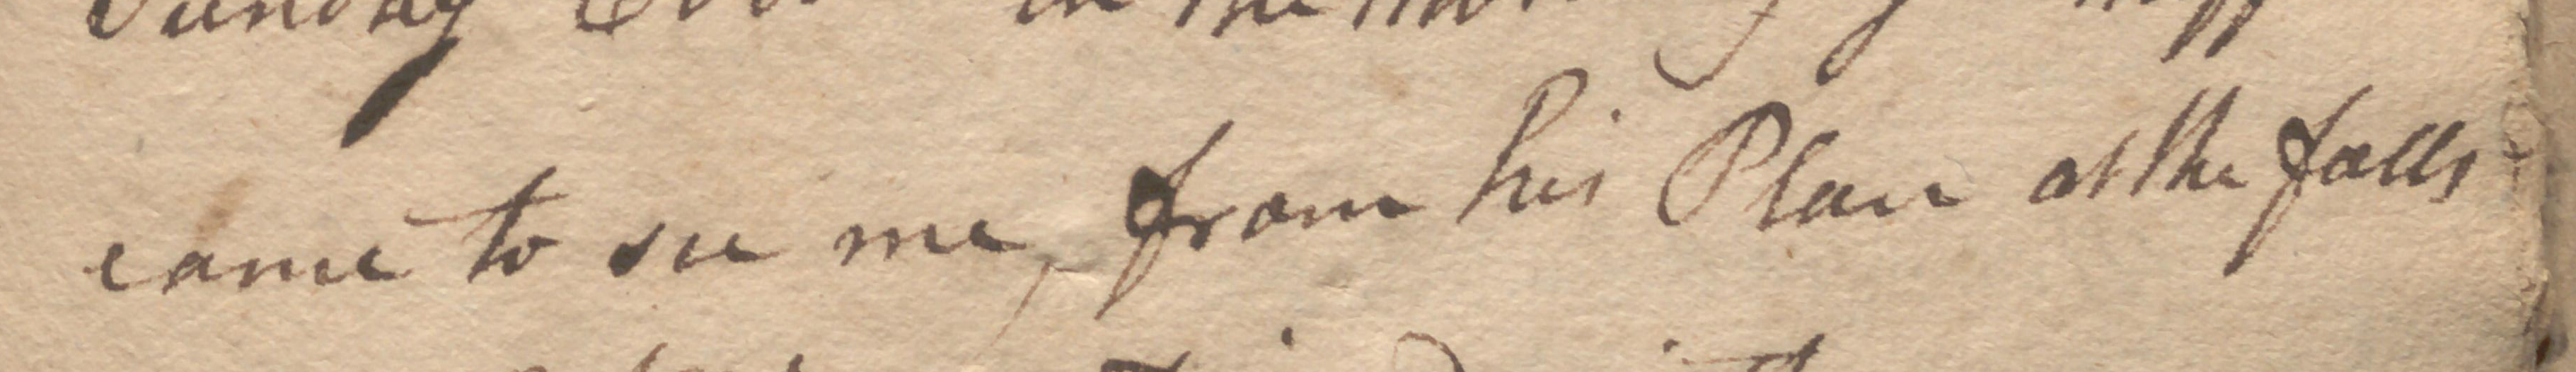came to see me, from his Plan at the falls
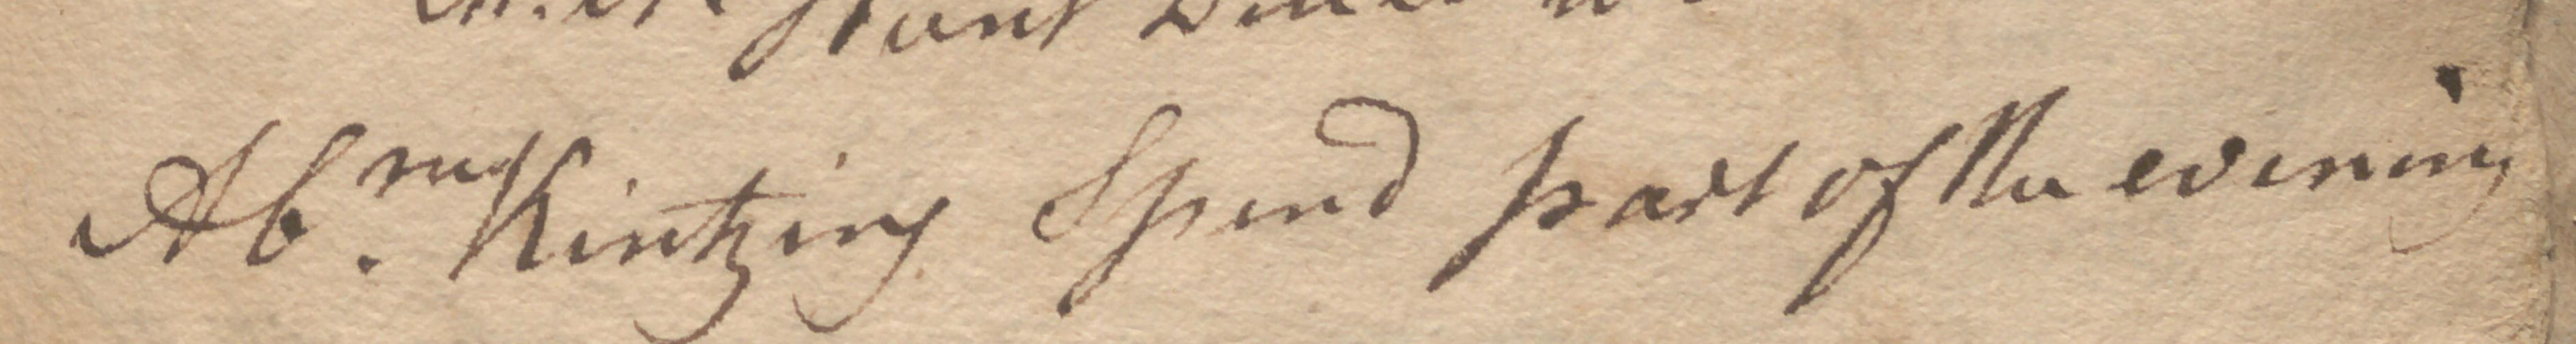Ab^m. Kintzing spend part of the evening
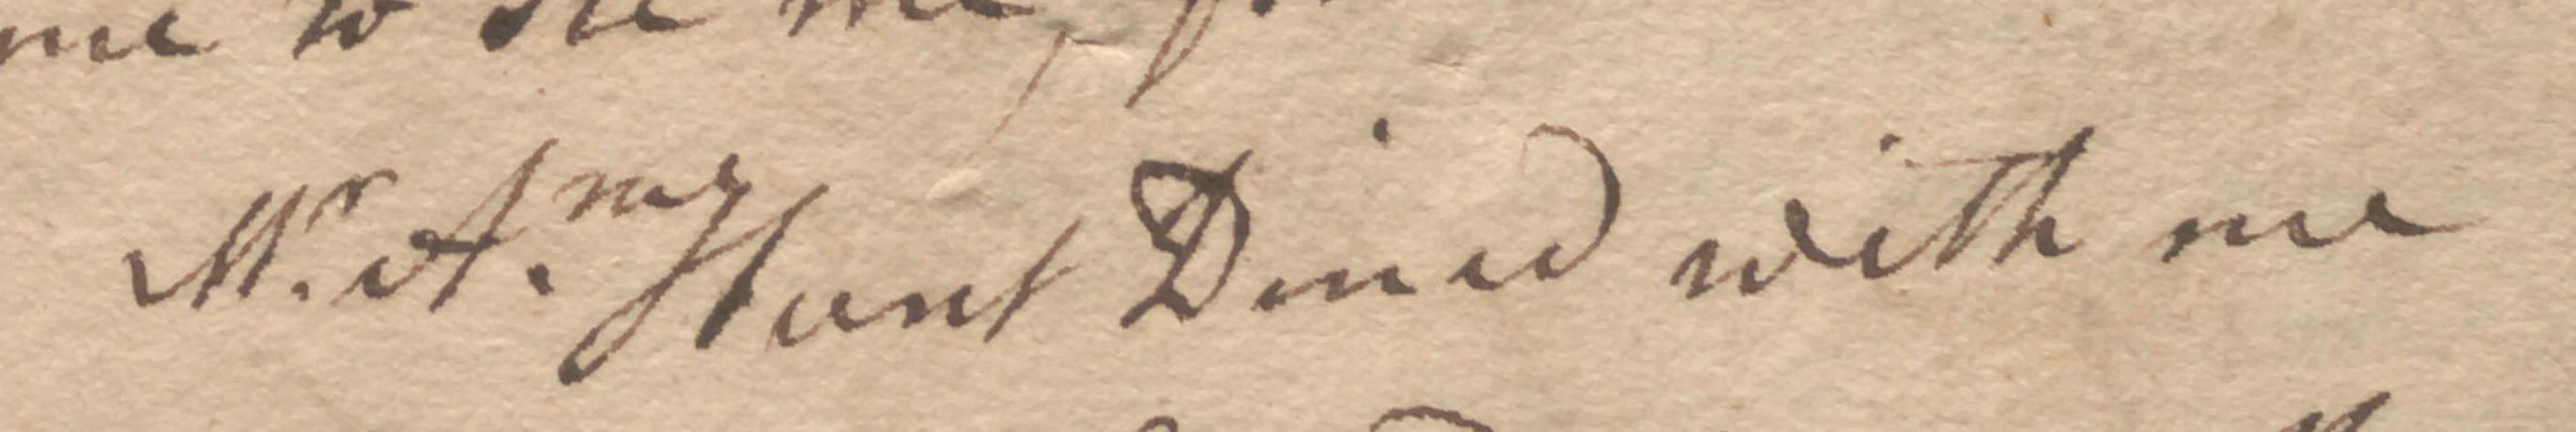M^r. A^m. Hunt Dined with me
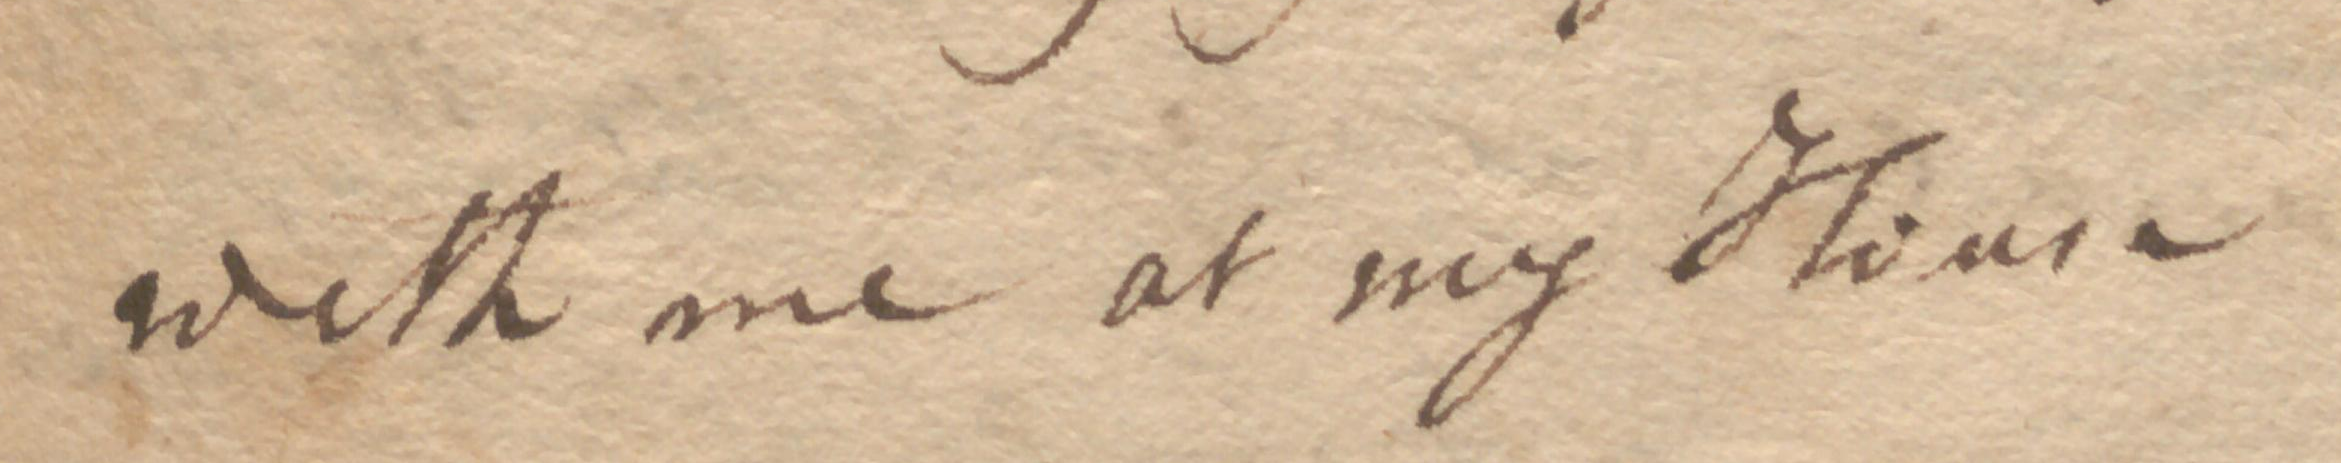with me at my House
